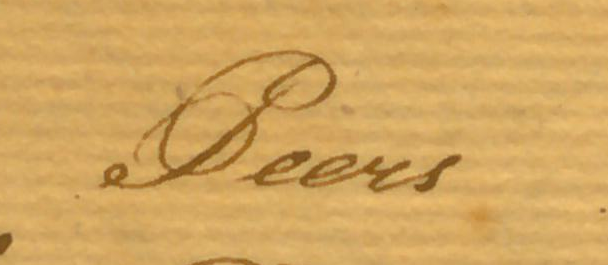Peers
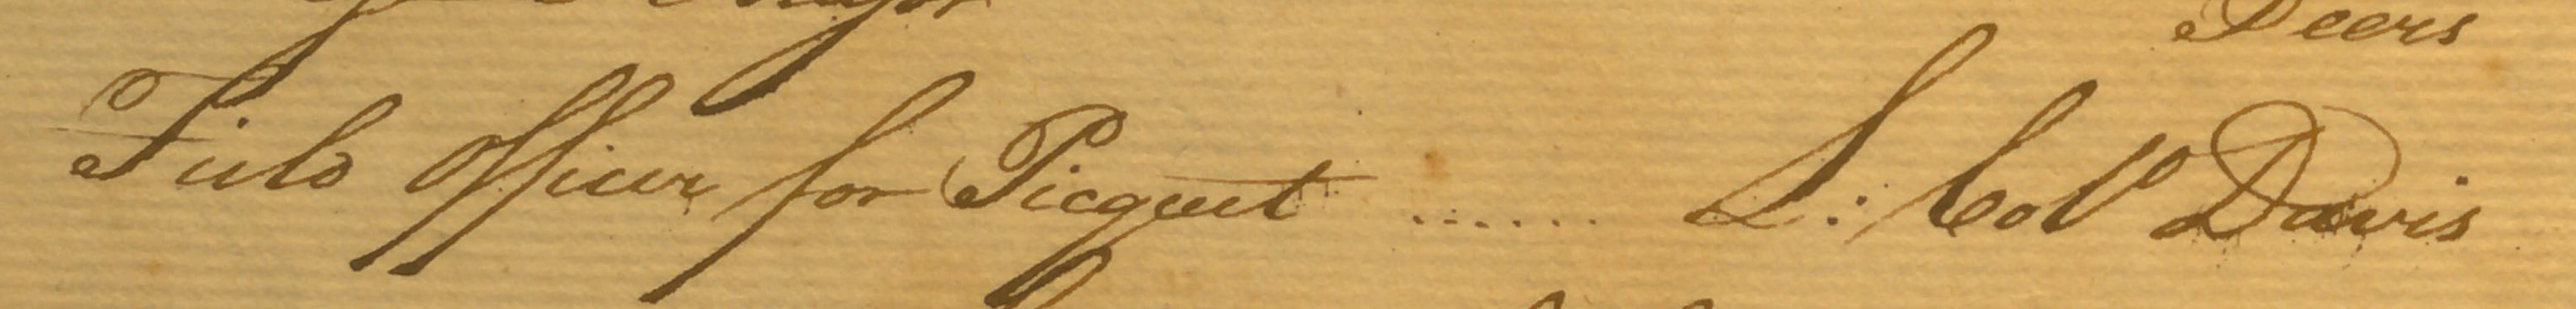Field officer for Picquet ..... L: Col^o Davis
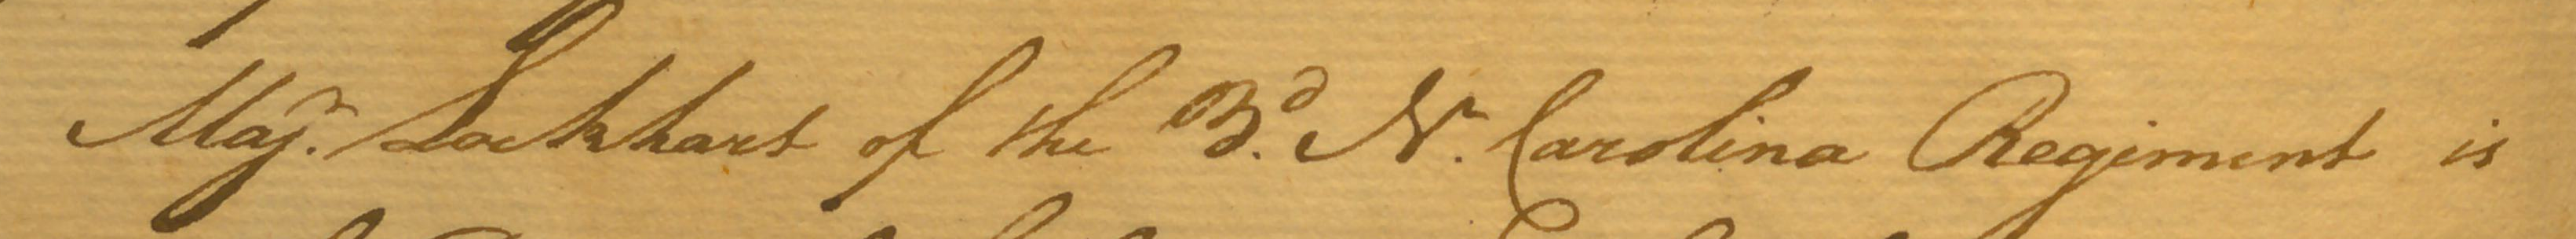Maj^r. Lockhart of the 3^d. N. Carolina Regiment is
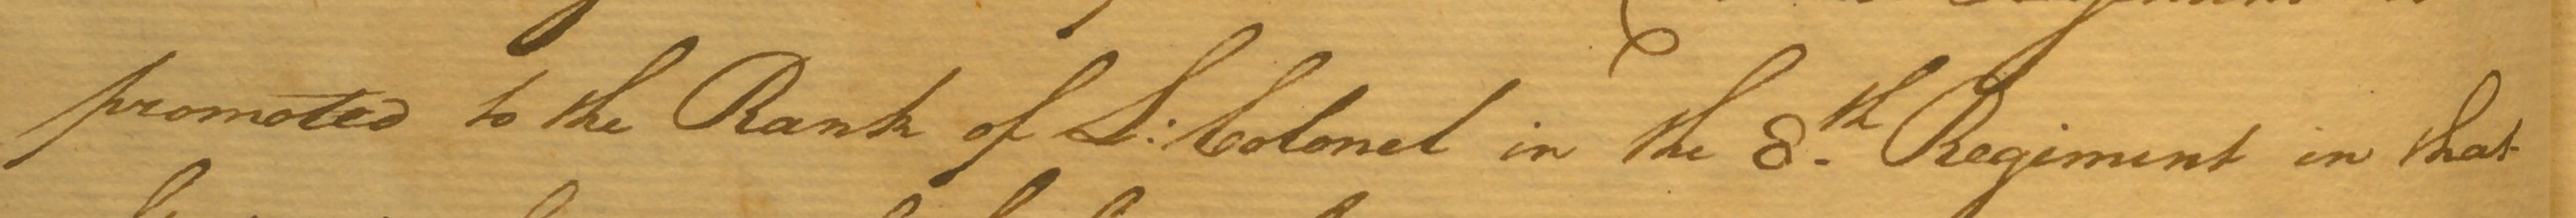promoted to the Rank of L: Colonel in the 8^th. Regiment in that
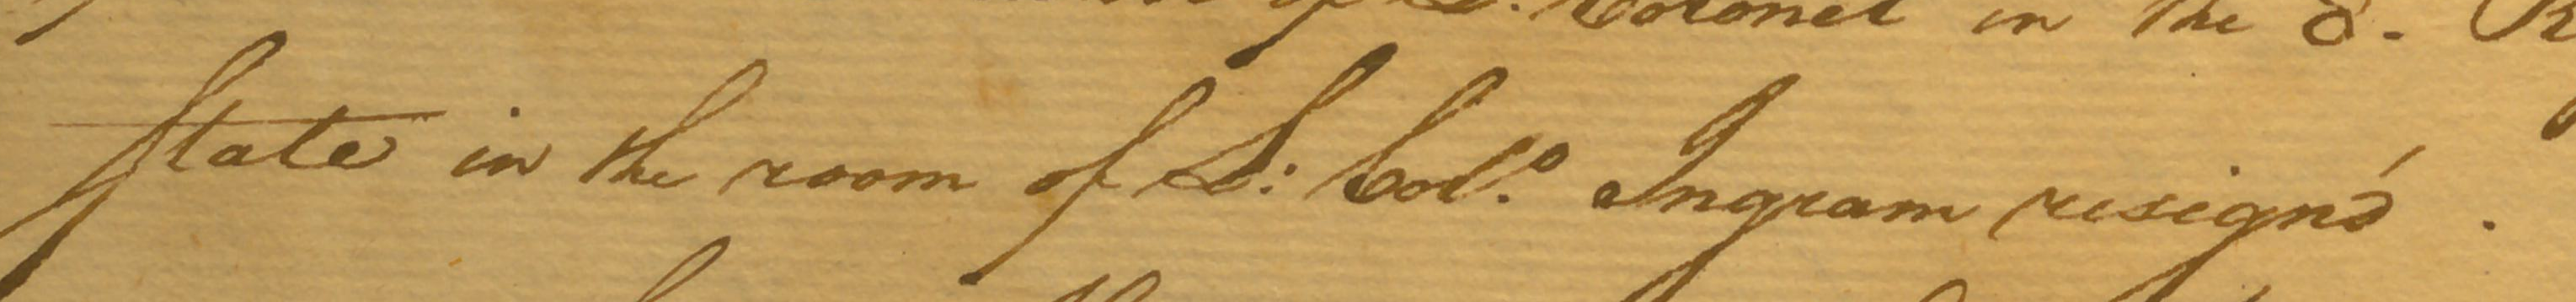state in the room of L: Col^o. Ingram resign'd.
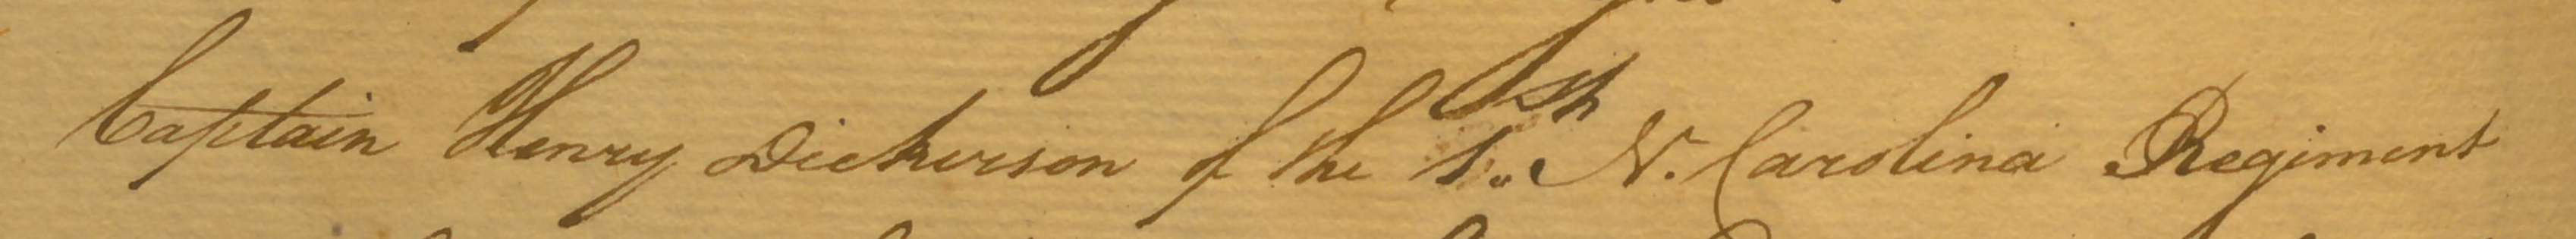Captain Henry Dickerson of the 1^st. N. Carolina Regiment
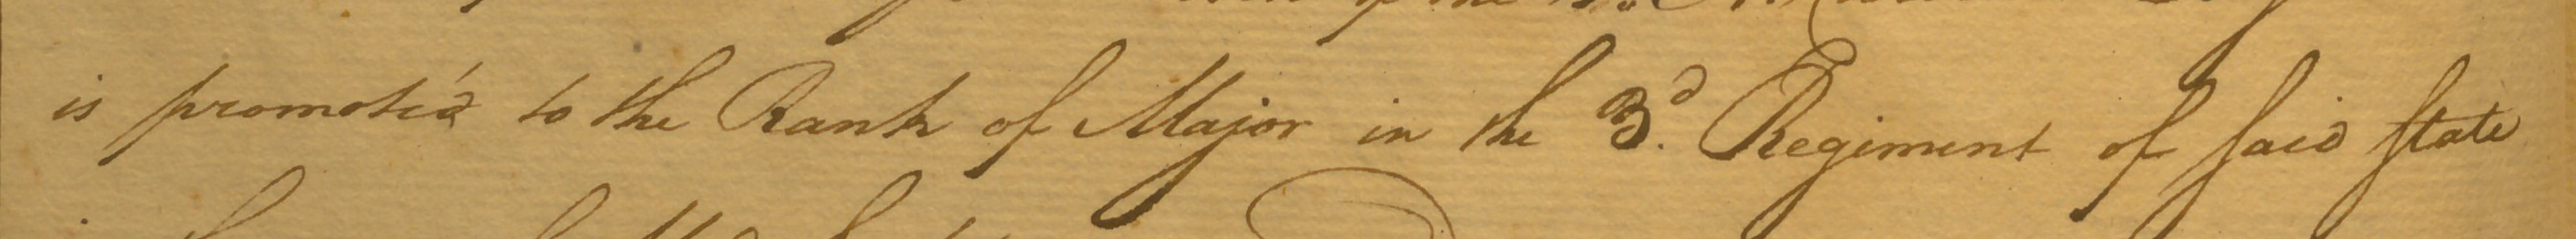is promot'd to the Rank of Major in the 3^d. Regiment of said state
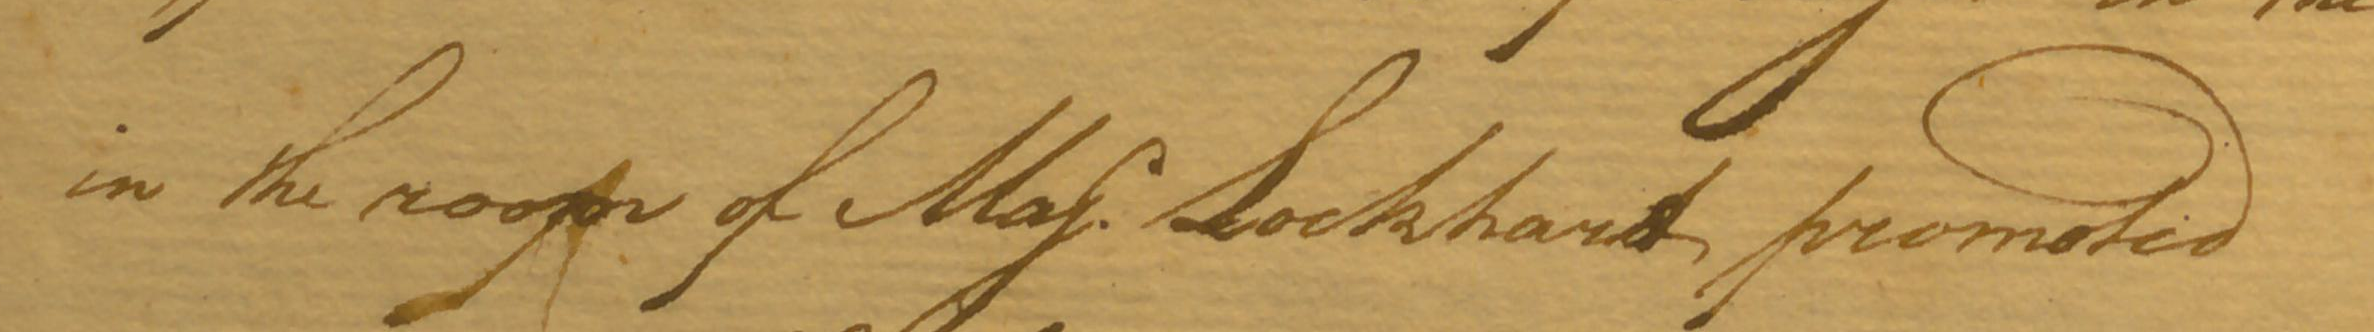in the room of Maj^r. Lockhart promoted
